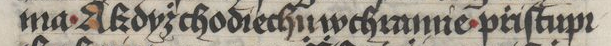ma.A kdyż choḋíechu.wchramie.pṙiſtupi¬
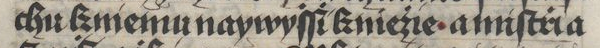chu kníemu naywyẛẛí knieżíe.a miſtṙi a
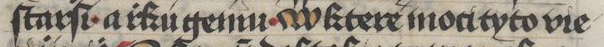ſtarẛí.a ṙkú gemu.W které moci tyto vie¬
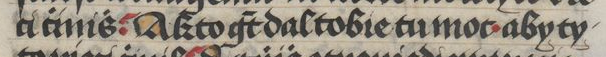ci ċiníṡ?A kto ḡt dal tobie tu moc.aby ty
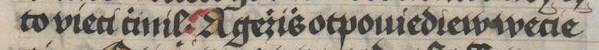to víecí ċinil?A geżíṡ otpouiediew wecie
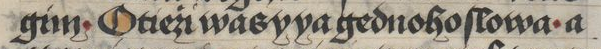gím.Otíeži was y ya gednoho ſlowa.a
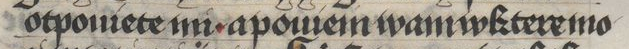otpouíete mi.a pouiem wam w ktere mo¬
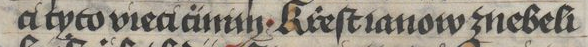ci tyto vzeci ċinim.Kṙeſt ianow znebeli
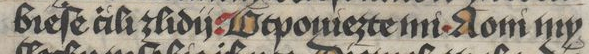bíeẛe ċili zlidij?Otpouiezte mi.A oni my¬
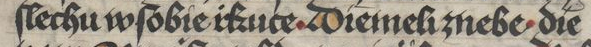ſlechu wſobie ṙkuce.Diemeli znebe.díe
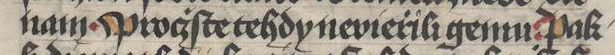nam.Procżſte tehdy nevíeṙili gemu?Pak
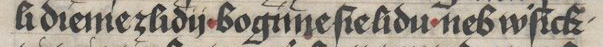li díeme zlidij.bogíme ſie lidu.neb wſick¬
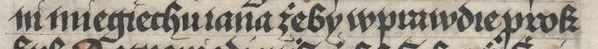ni miegiechu iana żeby wprawdie prok¬
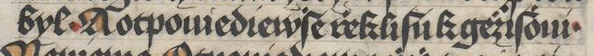byl.A otpouiediewẛe ṙekli ſu k geżíẛoui.
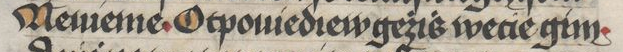Neuíeme.Otpouiediew geżíṡ wecie gím.
